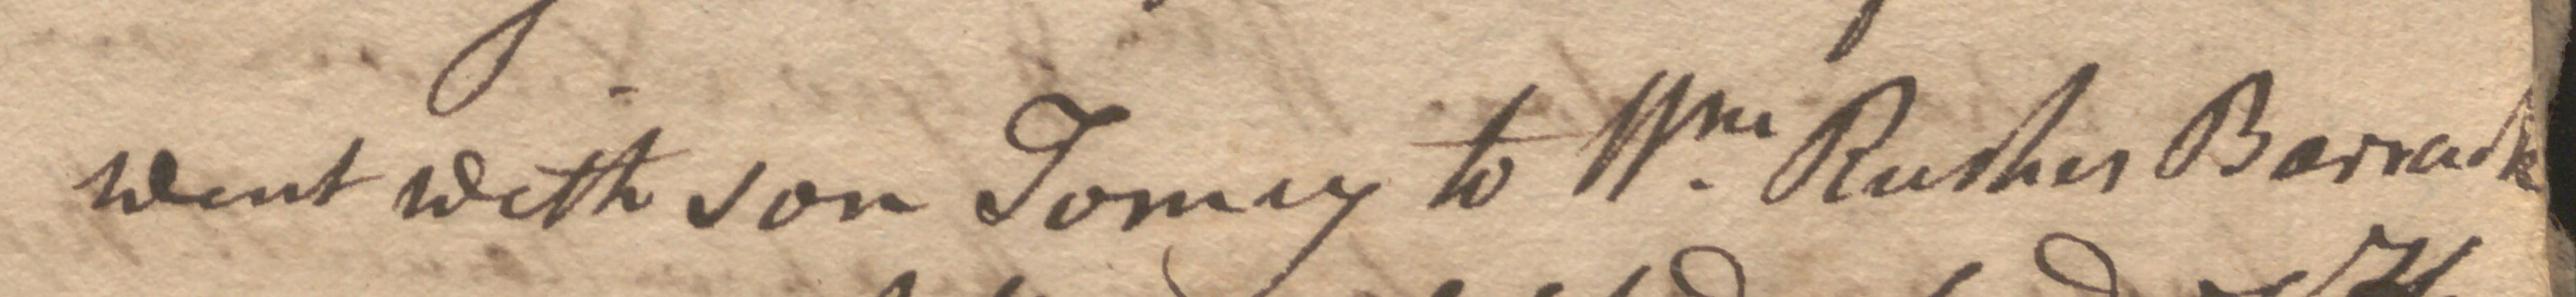went with son Tomey to W^m. Rushes Barrack
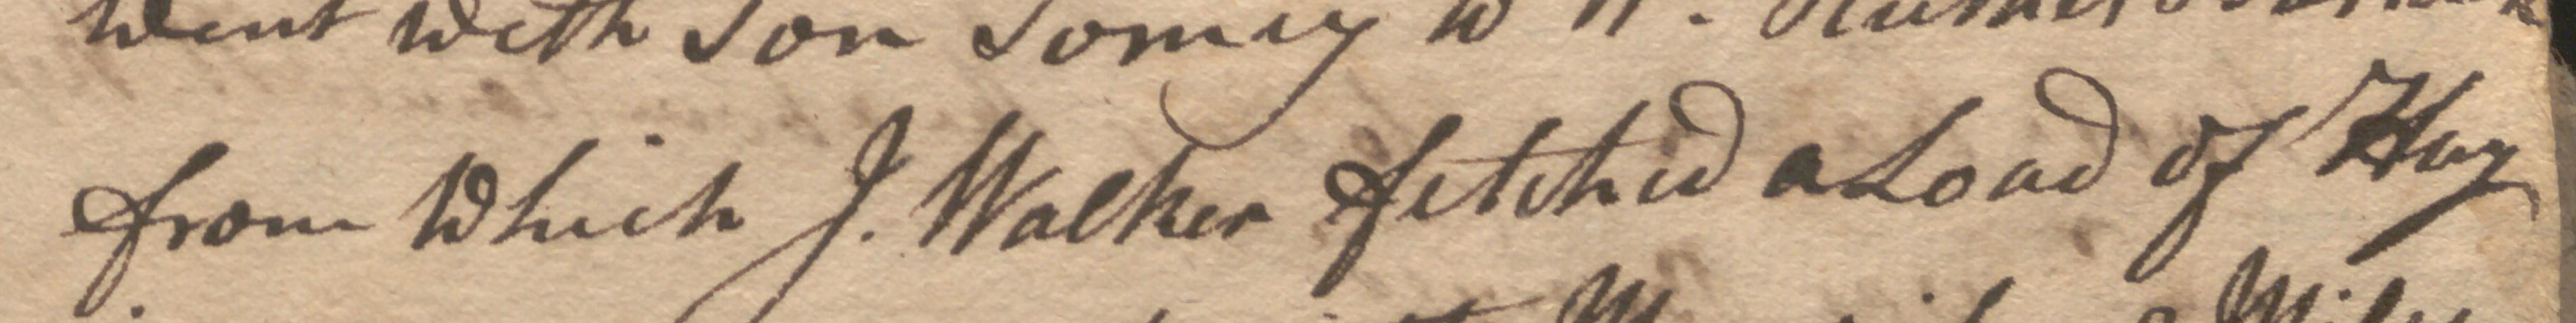from which J. Walker fetched a Load of Hay
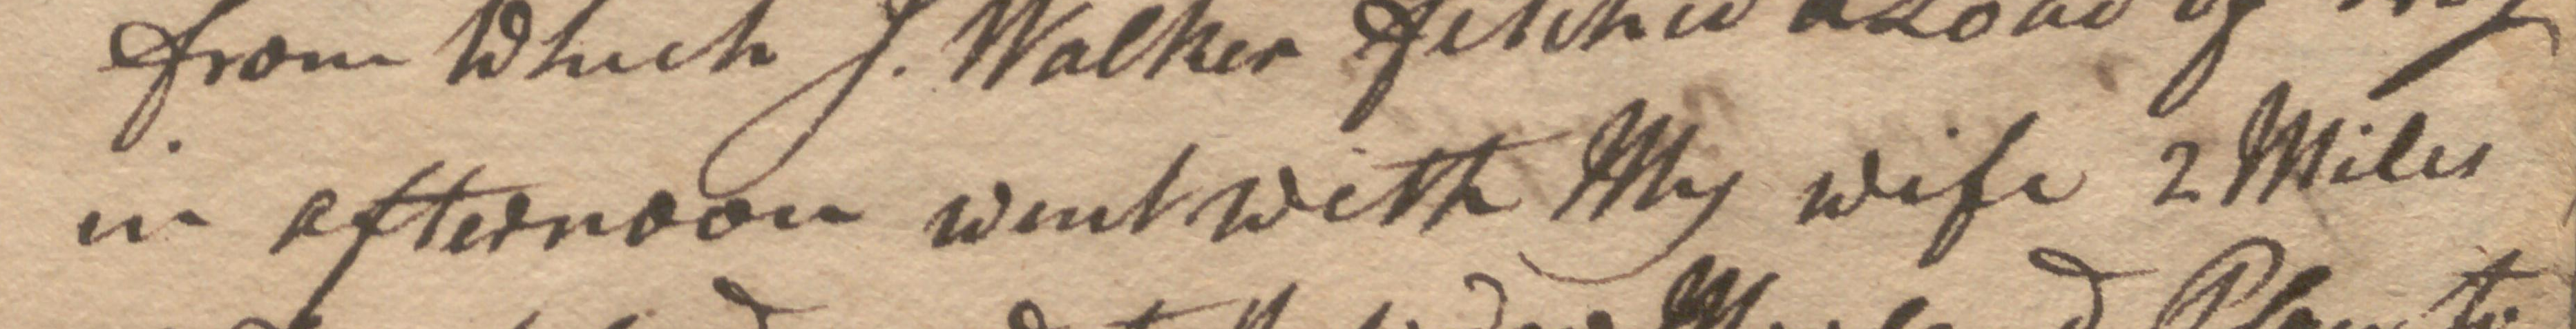in afternoon went with My wife 2 Miles
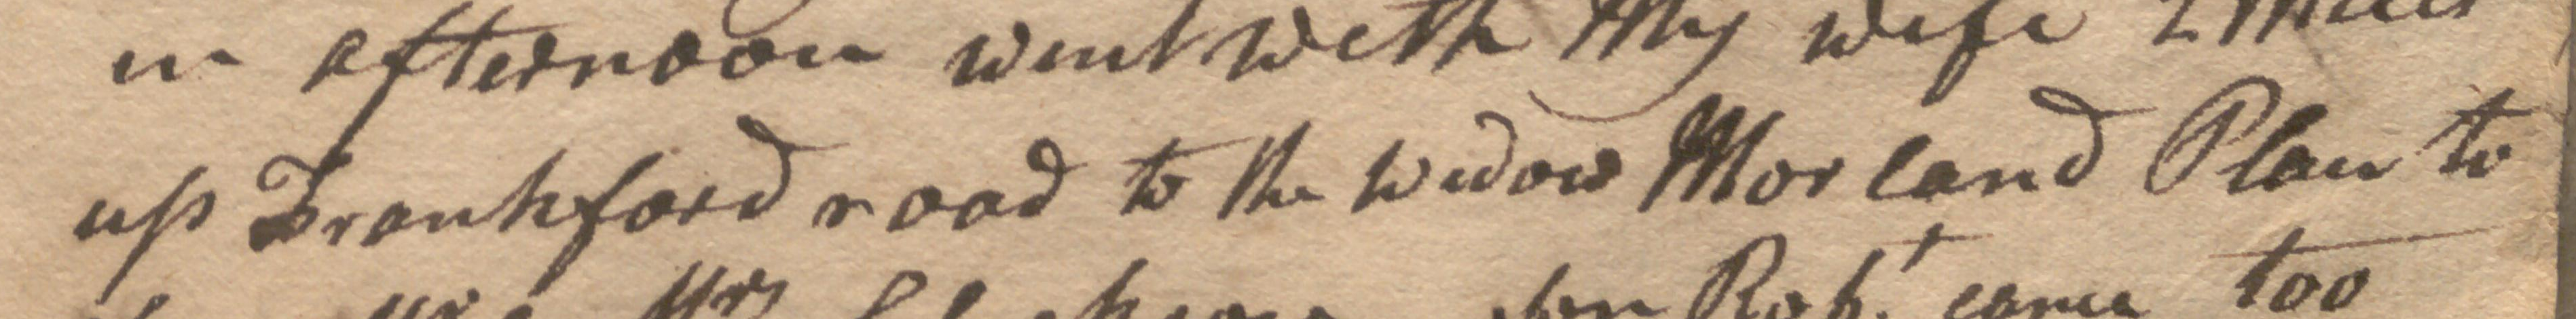up Frankford road to the Widow Morland Place to
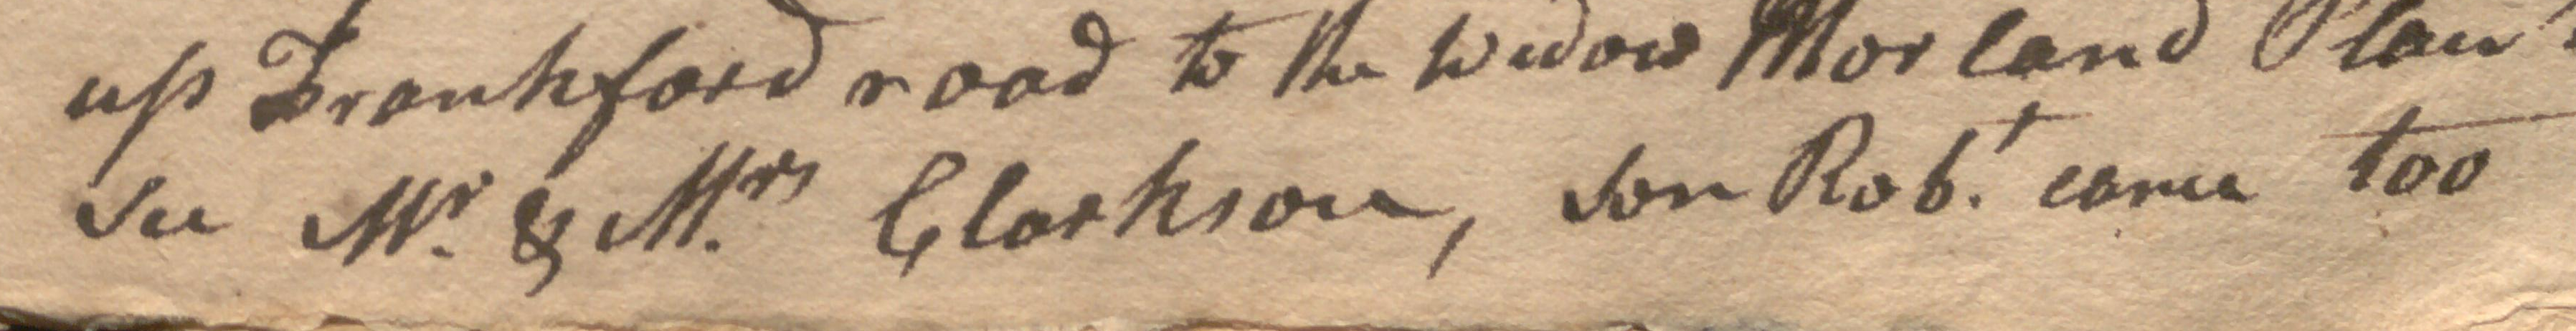see M^r. & M^r. Clarkson, son Rob^t. came too
